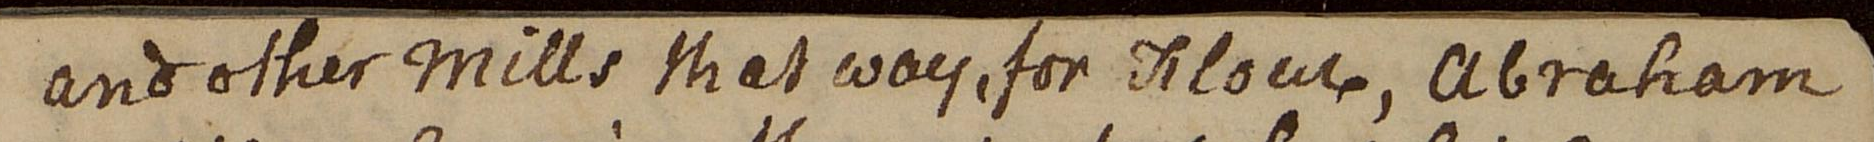and other mills that way, for Flour, Abraham
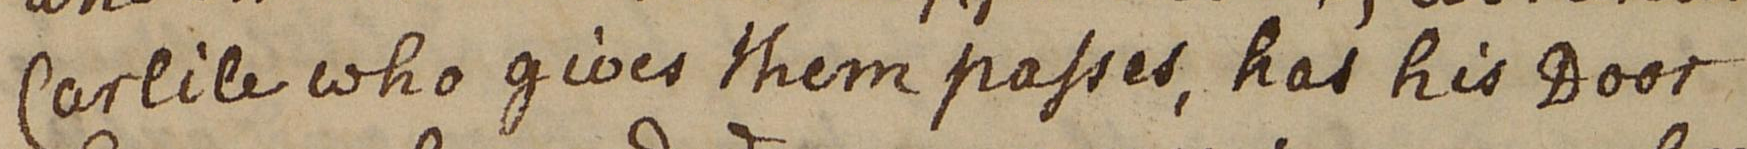Carlile who gives them passes, hat his Door
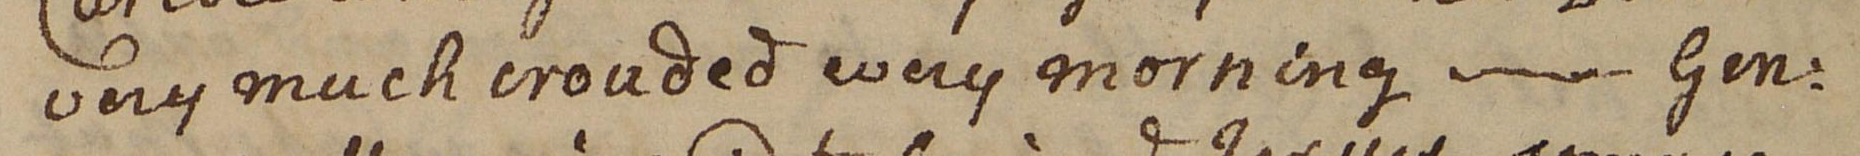very much crouded every morning- Gen:
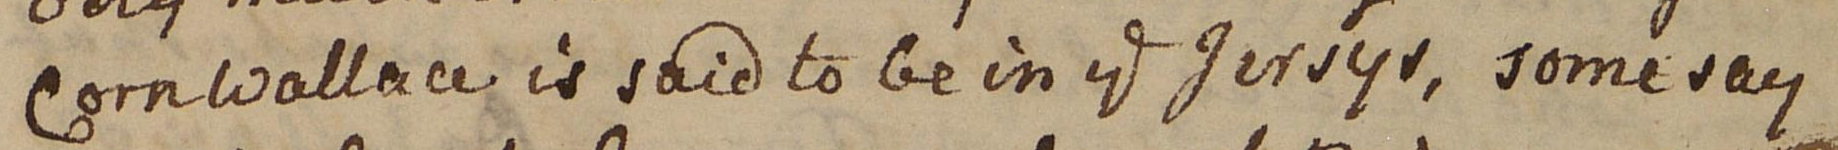Corn Wallace is said to be in y^e Jersys, some say
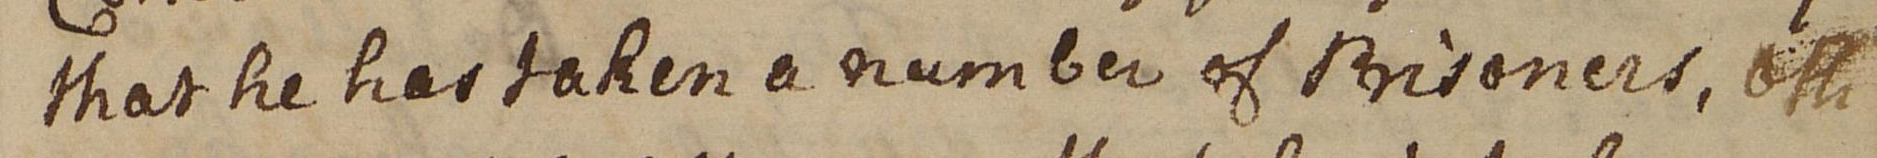that he has taken a number of Prisoners, [oth]
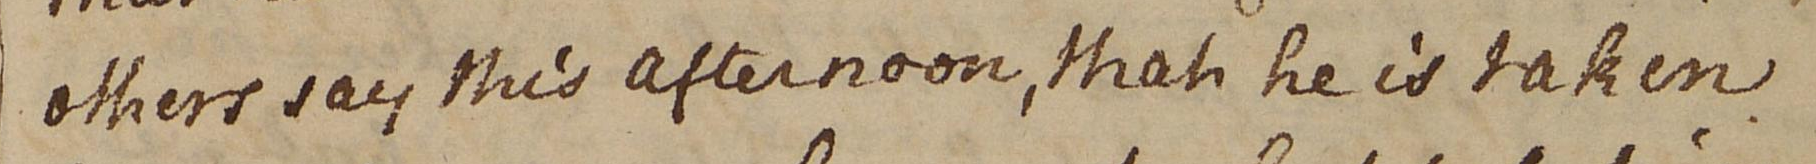others say this afternoon, that he is taken
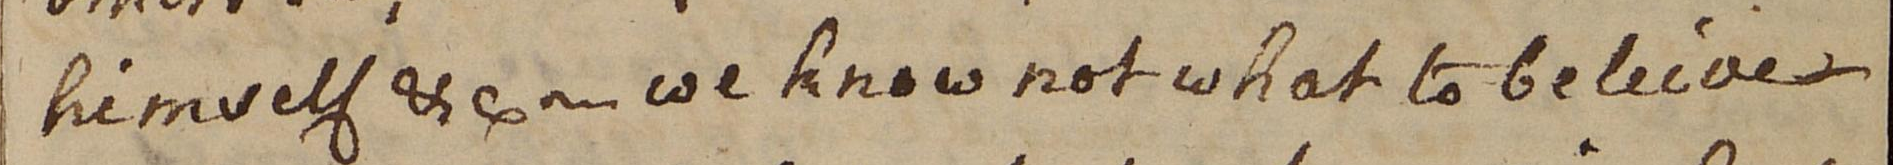himself &c- we know not what to beleive -
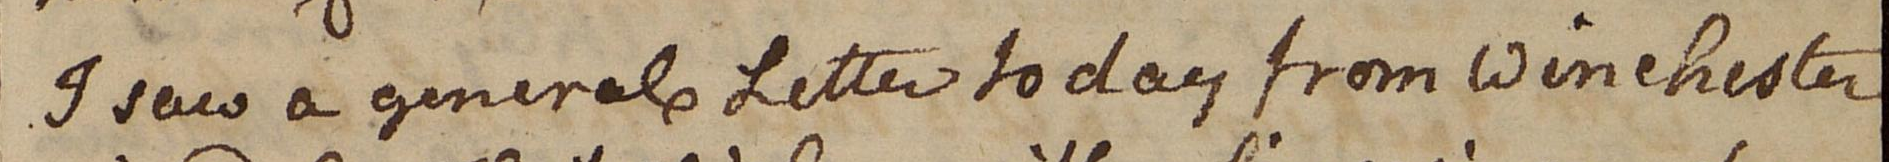I saw a general Letter to day from Winchester
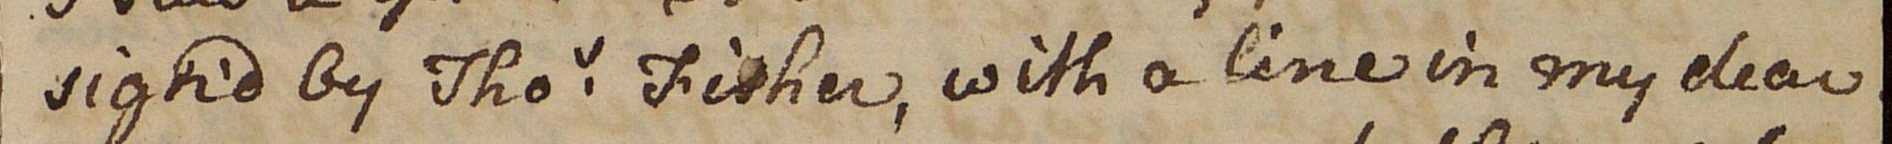sign'd by Tho^s. Fisher, with a line in my dear
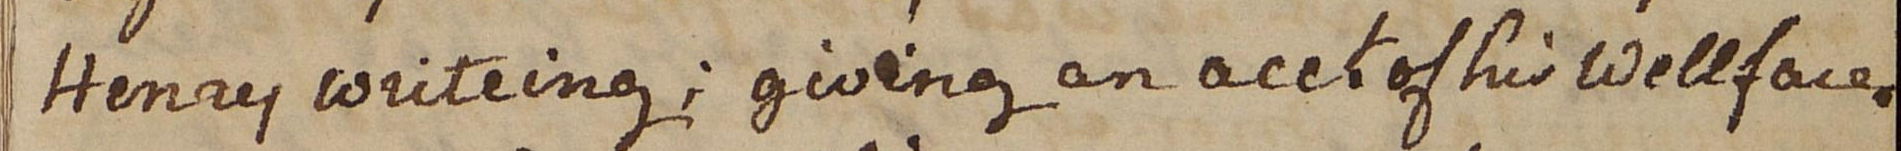Henry writeing; giving an acc^t. of his Wellfare.
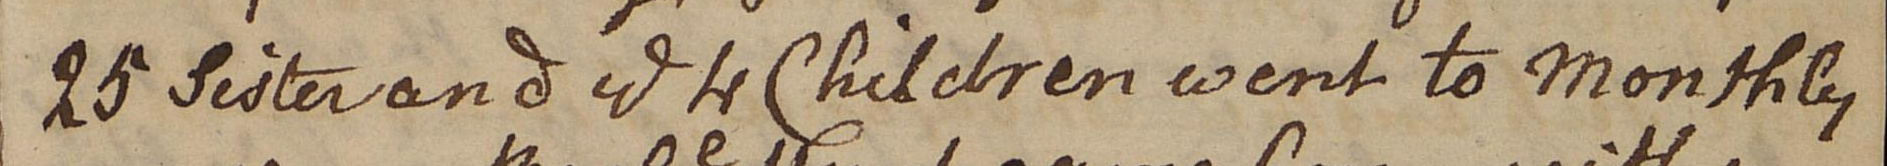25 Sister and y^e 4 Children went to Monthly
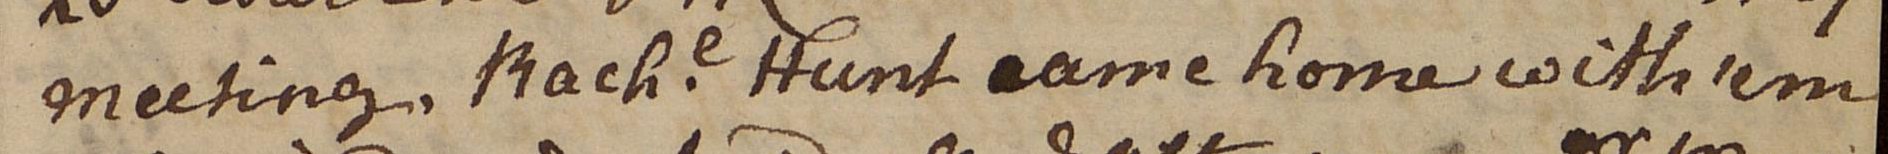meeting, Rach^l. Hunt came home with 'em
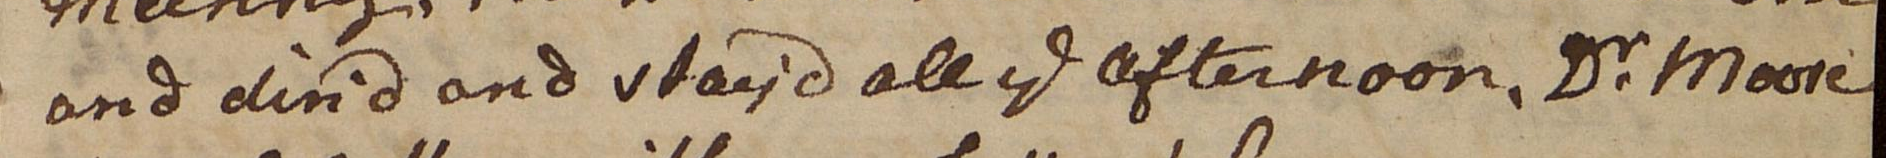and din'd and stay'd all y^e Afternoon, D^r. Moore
